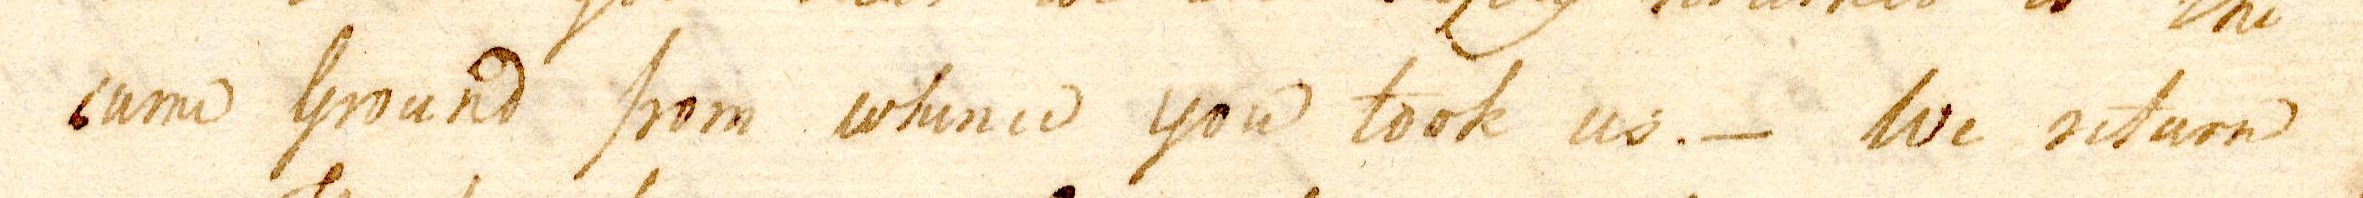same Ground from whence you took us. We return
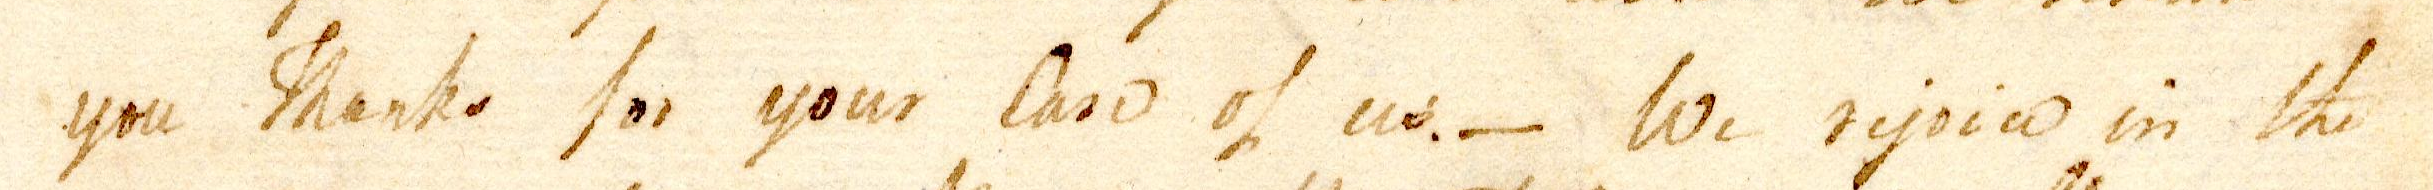you Thanks for your Care of us.- We rejoice in the
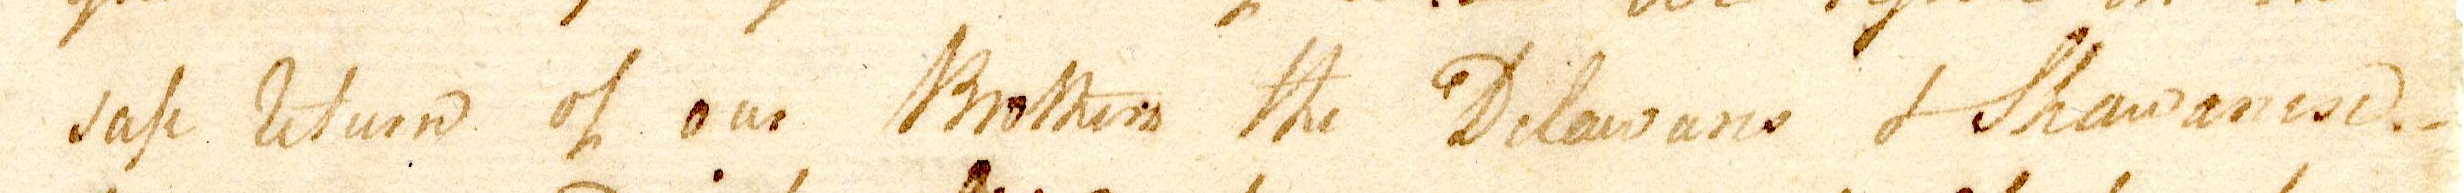safe return of our Brothers the Delawares & Shawanese.
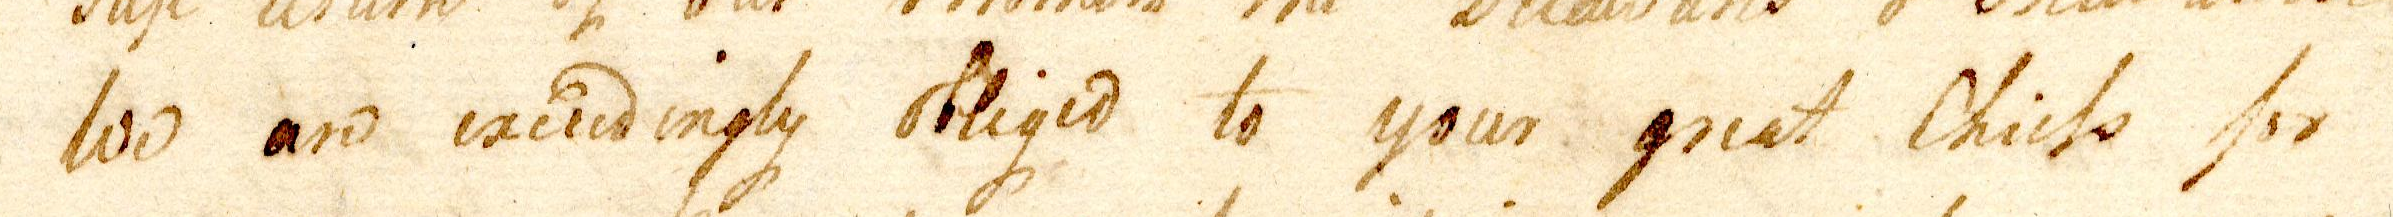We are exceedingly obliged to your great Chiefs for
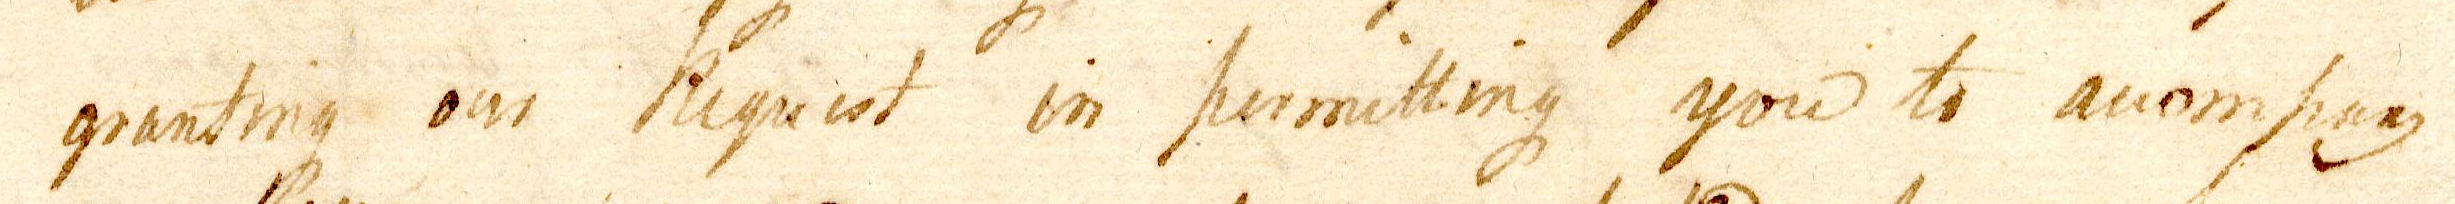granting our Request in permitting you to accompany
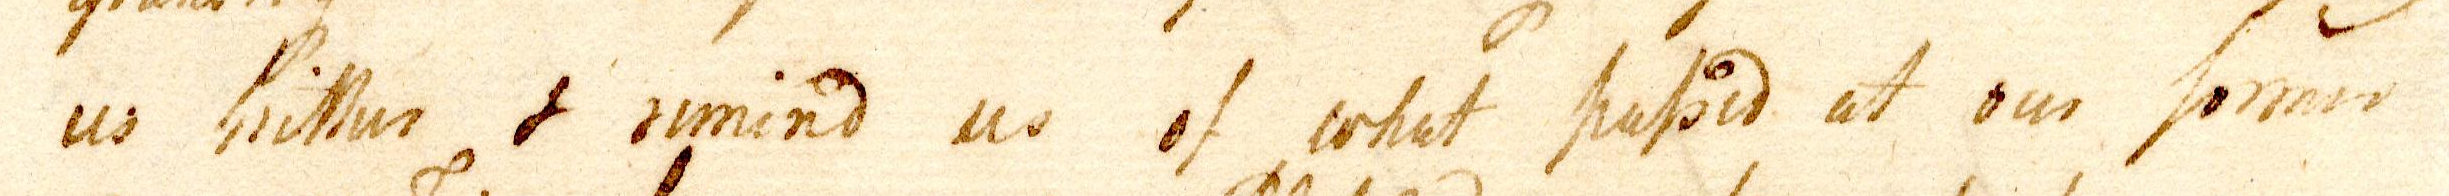us hither & remind us of what passed at our former
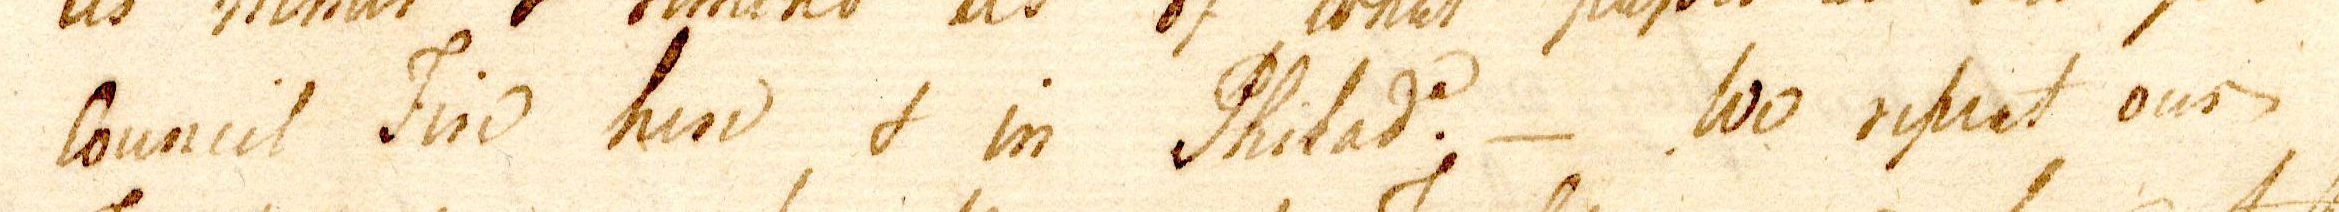Council Fire here & in Philad^a.- We respect our
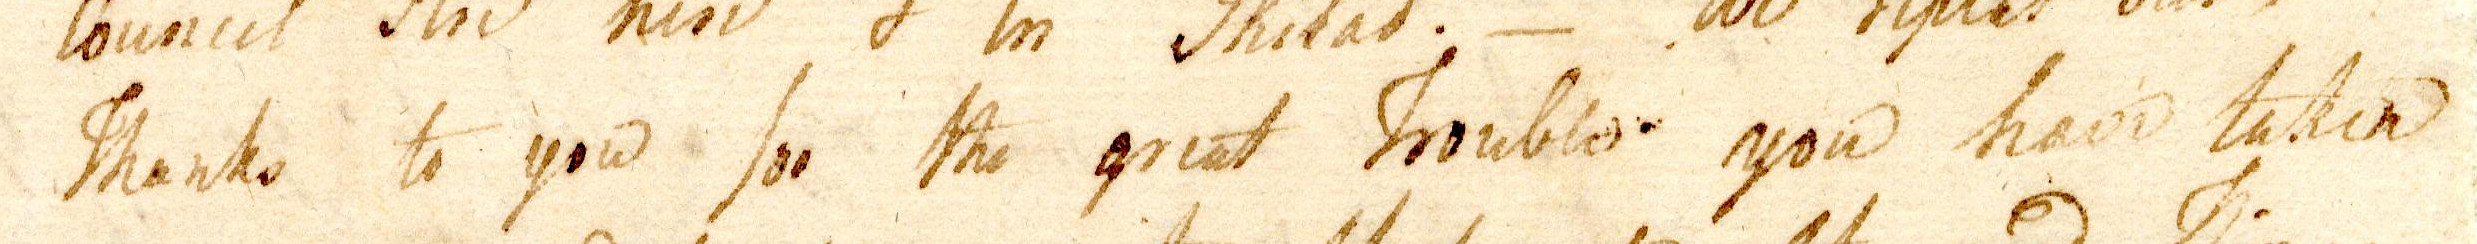Thanks to you for the great Troubles you have taken
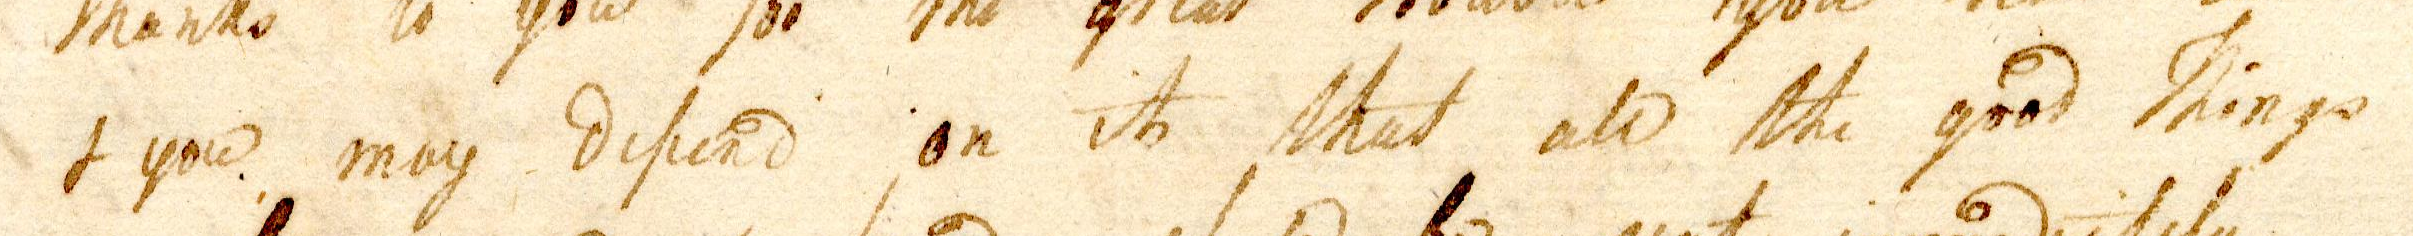& you may depend on its that all the good Things
